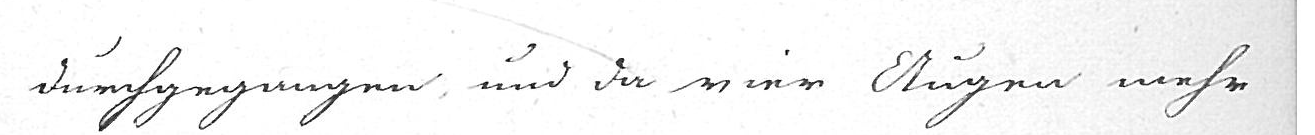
durchgegangen, und da vier Augen mehr
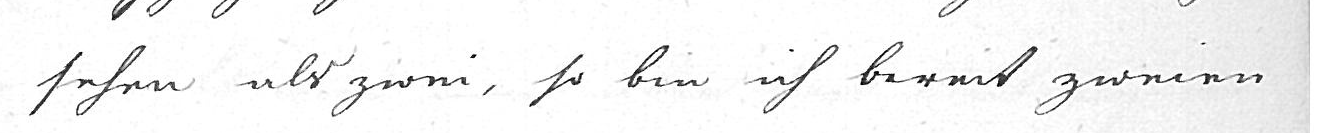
sehen als zwei, so bin ich bereit zweien
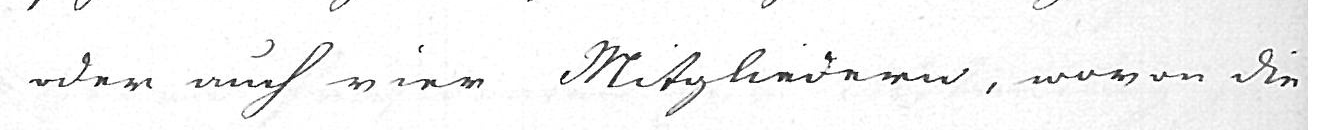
oder auch vier Mitgliedern, wovon die
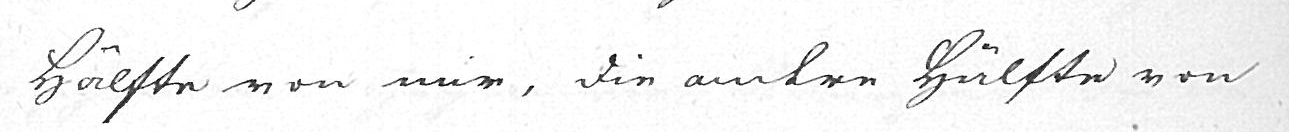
Hälfte von mir, die andere Hälfte von
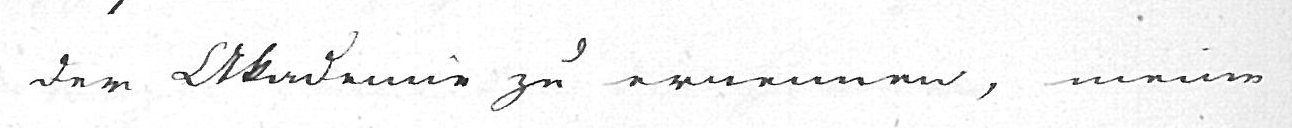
der Akademie zu ernennen, meine
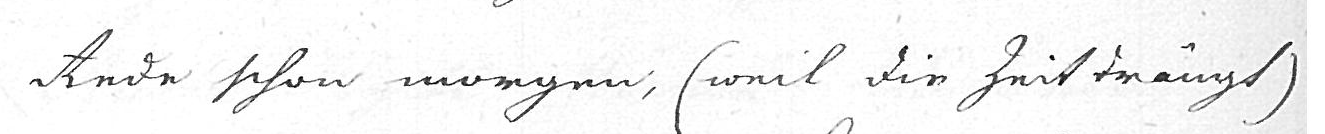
Rede schon morgen, (weil die Zeit drängt)
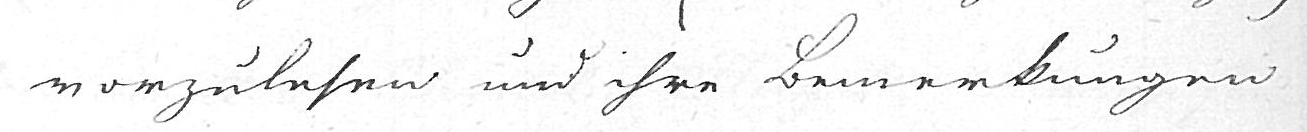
vorzulesen und ihre Bemerkungen
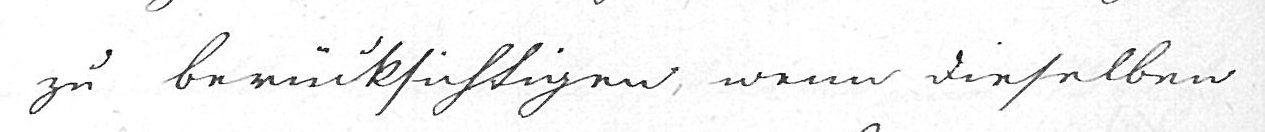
zu berücksichtigen, wenn dieselben
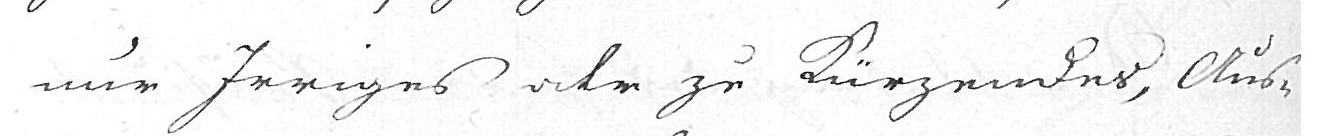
nur Irriges oder zu Kürzendes, Aus-
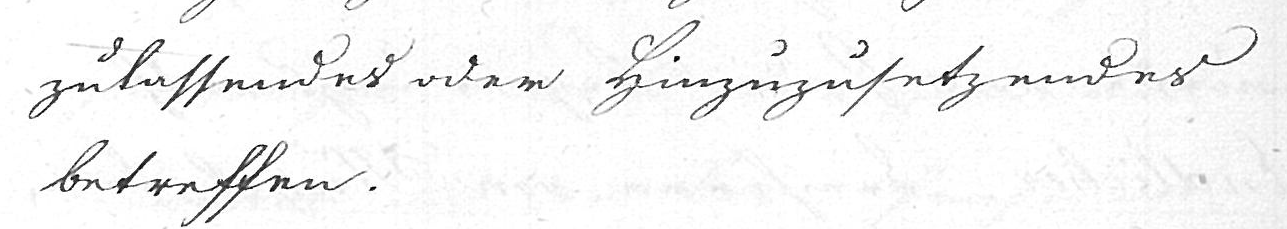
zulassendes oder Hinzuzusetzendes
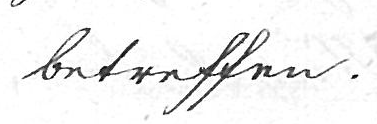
betreffen.
